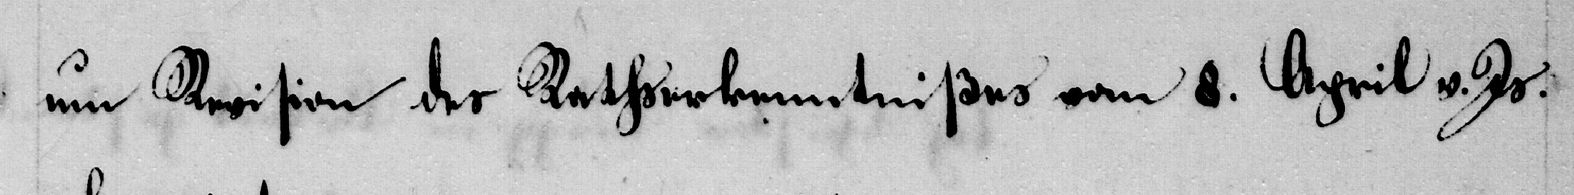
um Revision des Rathserkenntißes vom 8. April v. Js.
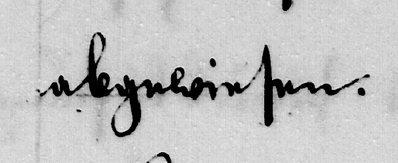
abgewiesen.
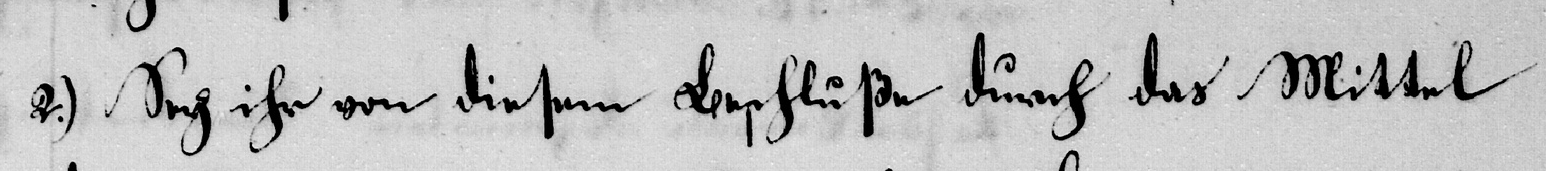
2.) Sey ihr von diesem Beschluß durch das Mittel
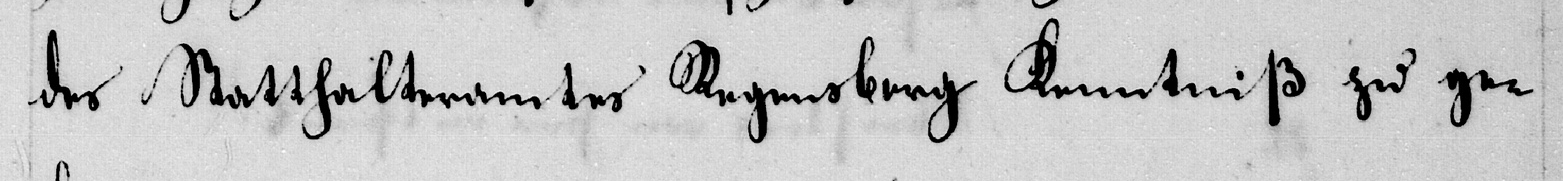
des Statthalteramtes Regensberg Kenntniß zu ge¬
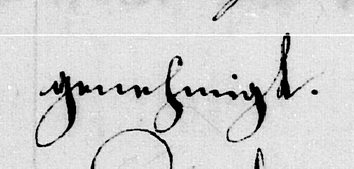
genehmigt.
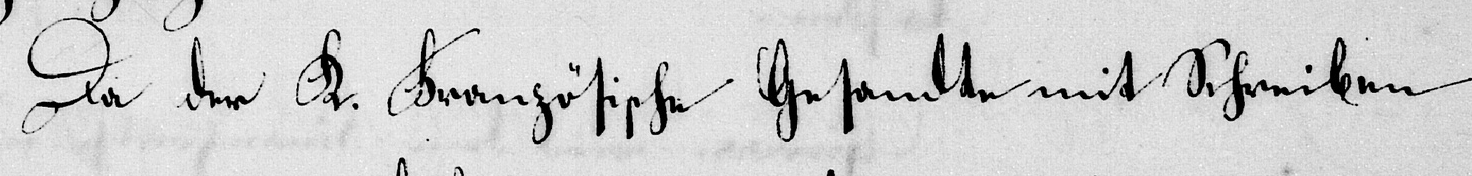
Da der K. Französische Gesandte mit Schreiben
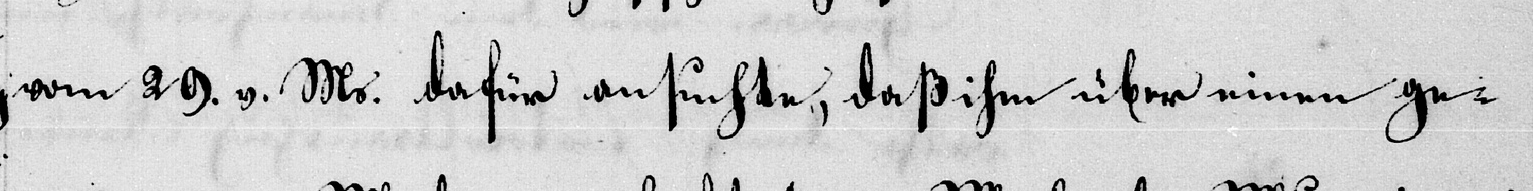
vom 29. v. Ms. dafür ansuchte, daß ihm über einen ge¬
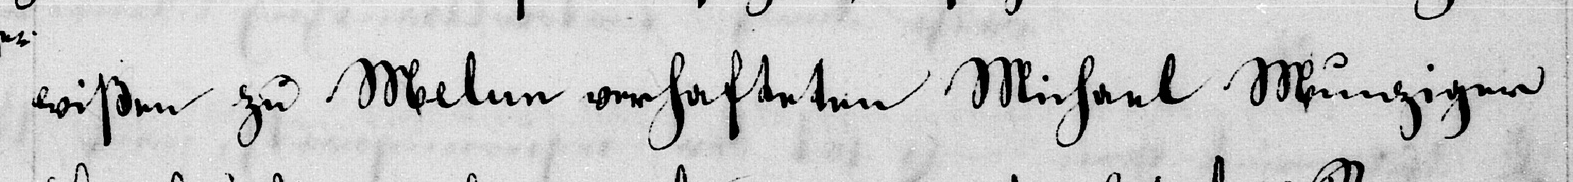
wißen zu Melun verhafteten Michael Munziger
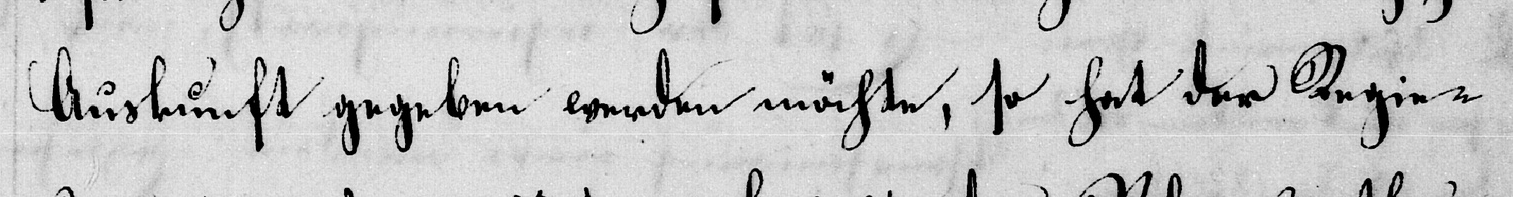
Auskunft gegeben werden möchte, so hat der Regie¬
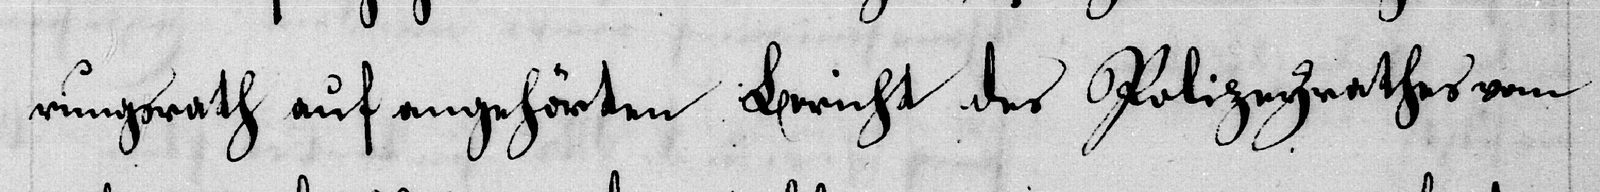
rungsrath auf angehörten Bericht des Policeyrathes vom
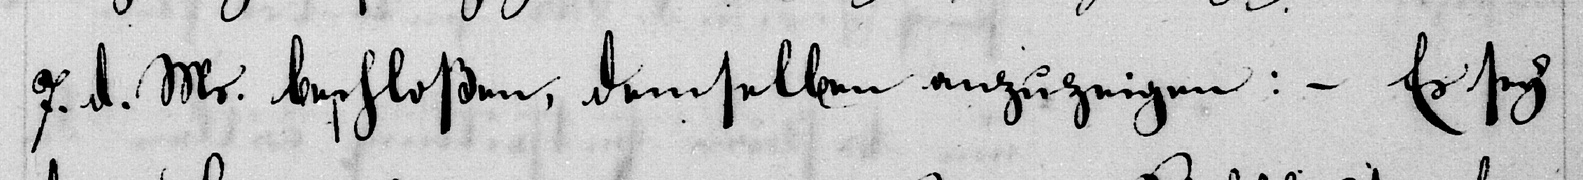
7. d. Ms. beschloßen, demselben anzuzeigen: – Es sey
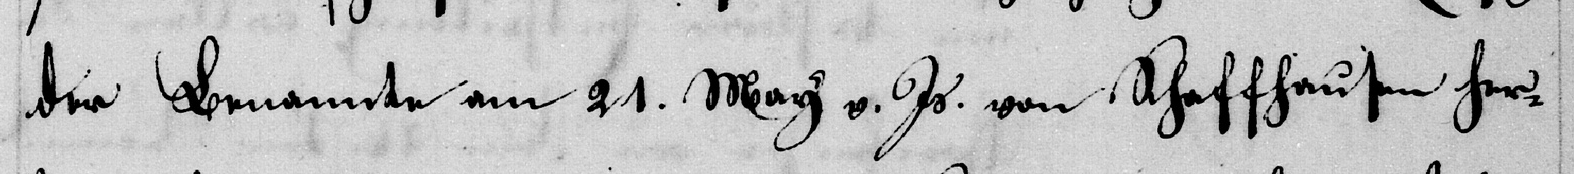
der Benannte am 21. März v. Js. von Schaffhausen her¬
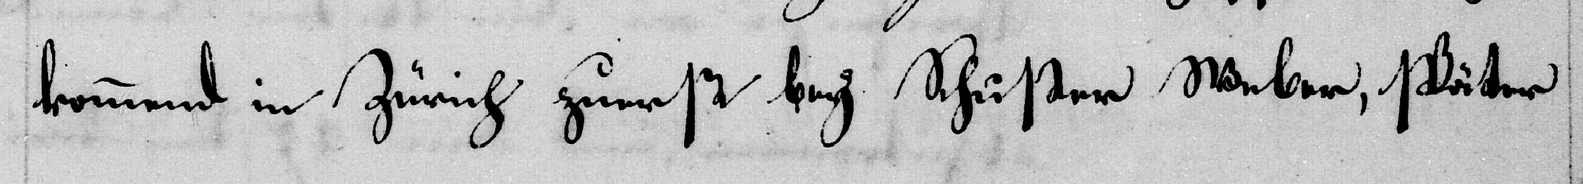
kommend in Zürich zuerst bey Schuster Weber, später
